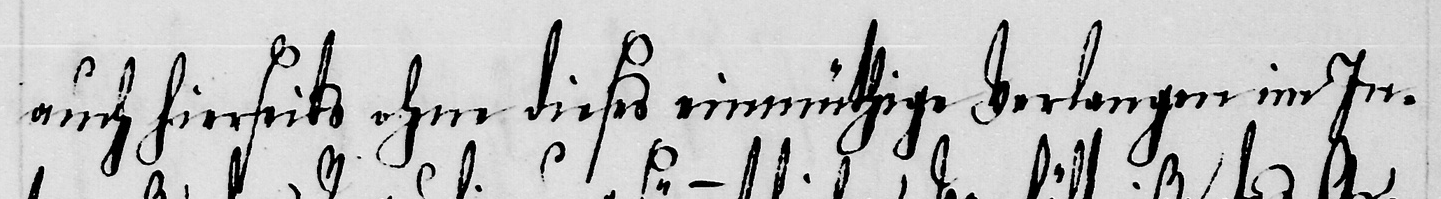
auch hierseits ohne dieses einmüthige Verlangen im In¬
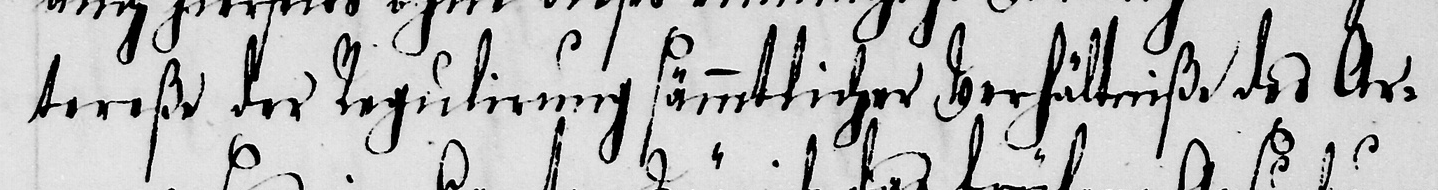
tereße der Regulirung sämmtlicher Verhältniße des Ar¬
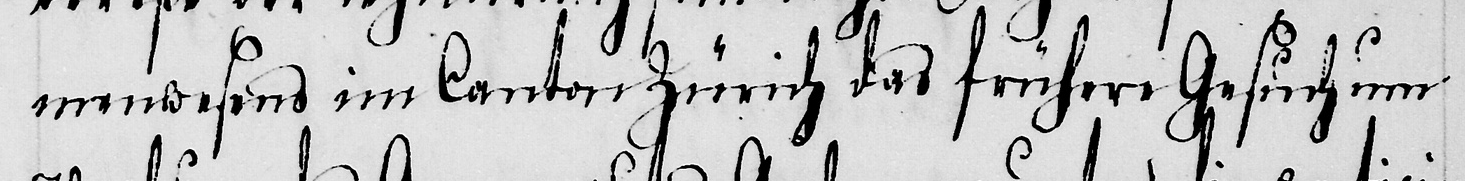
menwesens im Canton Zürich das frühere Gesuch um
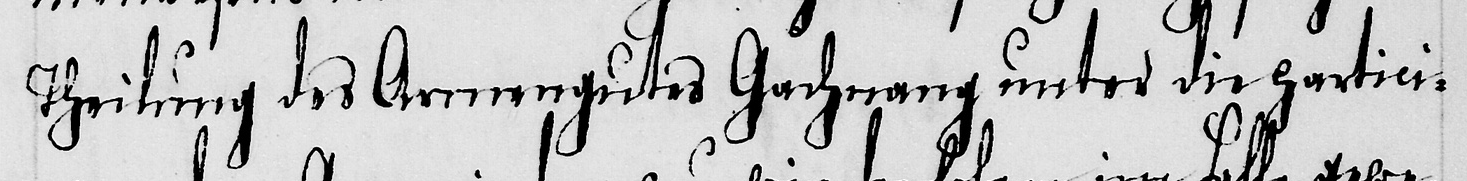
Theilung des Armengutes Gachnang unter die partici¬
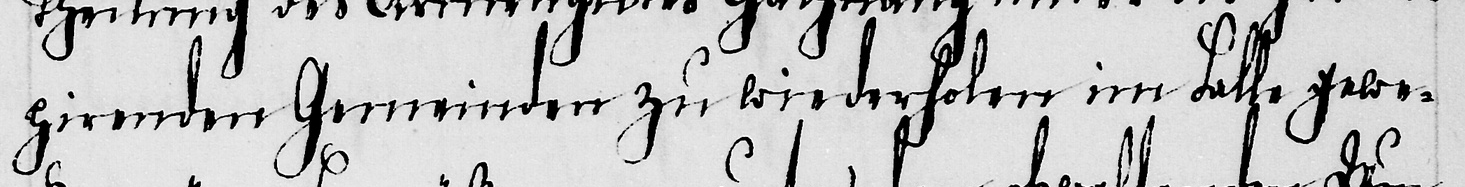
pirenden Gemeinden zu wiederholen im Falle gewe¬
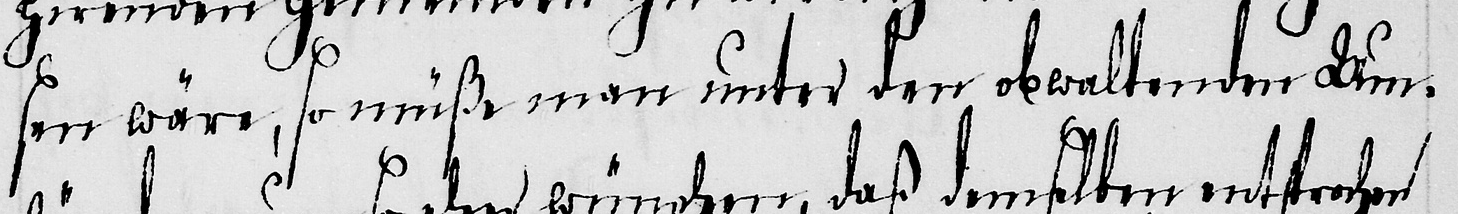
sen wäre, so müße man unter den obwaltenden Um¬
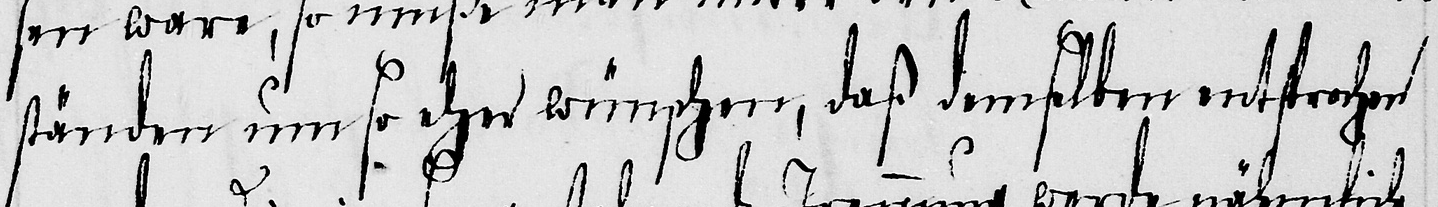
ständen um so eher wünschen, daß demselben entsprochen
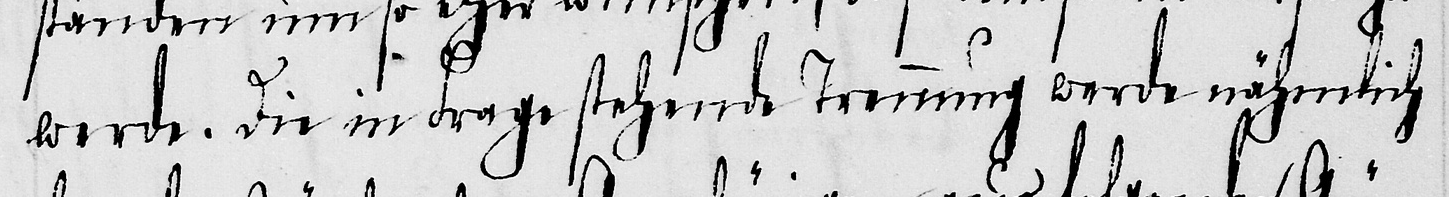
werde. Die in Frage stehende Trennung werde nähmlich
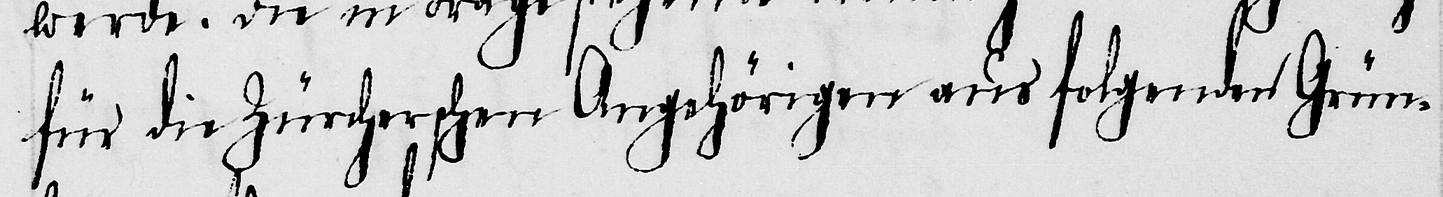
für die Zürcherschen Angehörigen aus folgenden Grün¬
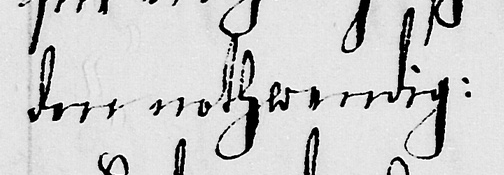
den nothwendig:
